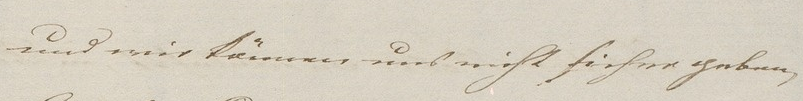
und wir können uns nicht sicher geben,
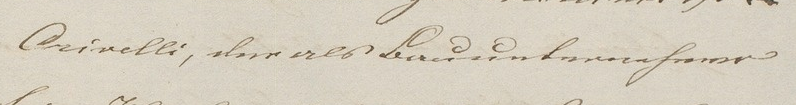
Crivelli , der als Bauunternehmer
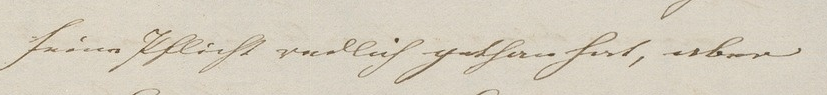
seine Pflicht redlich gethan hat, aber
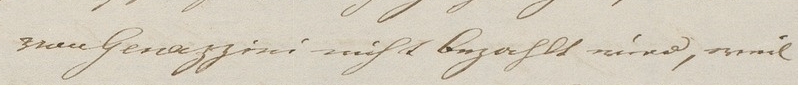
von Genazzini nicht bezahlt wird, weil
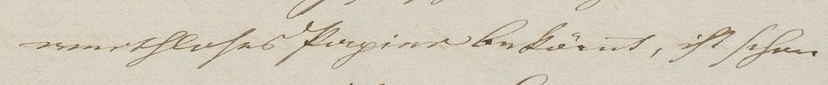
werthloses Papier bekömmt, ist schon
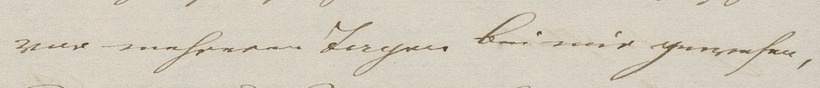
vor mehreren tagen bei mir gewesen,
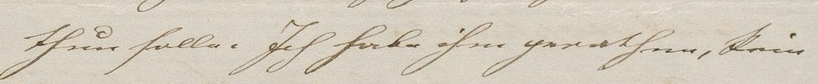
thun solle. Ich habe ihm gerathen, kein
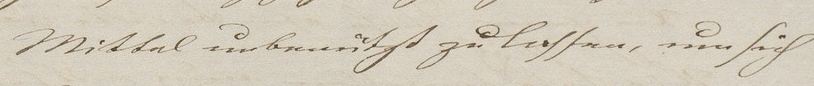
Mittel unbenützt zu lassen, um sich
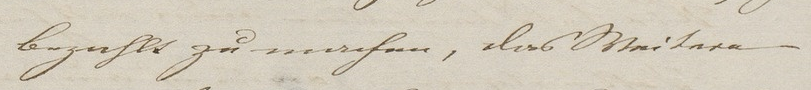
bezahlt zu machen, das Weitere
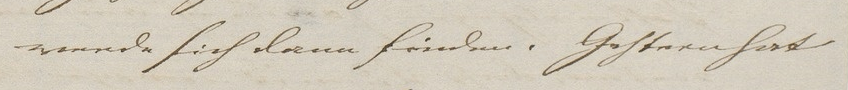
werde sich dann finden. Gestern hat
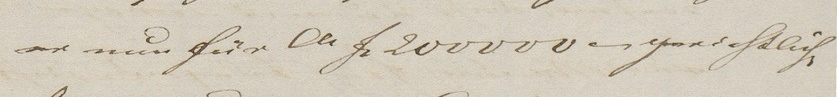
er nun für Ca Fr 200000 gerichtlich
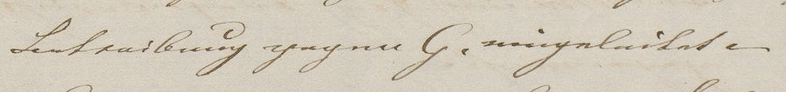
Betreibung gegen G. eingeleitet.
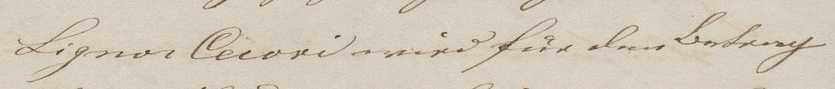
Signor Cecovi wird für den Betrag
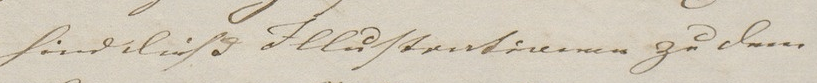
sind dieß Illustrationen zu dem
